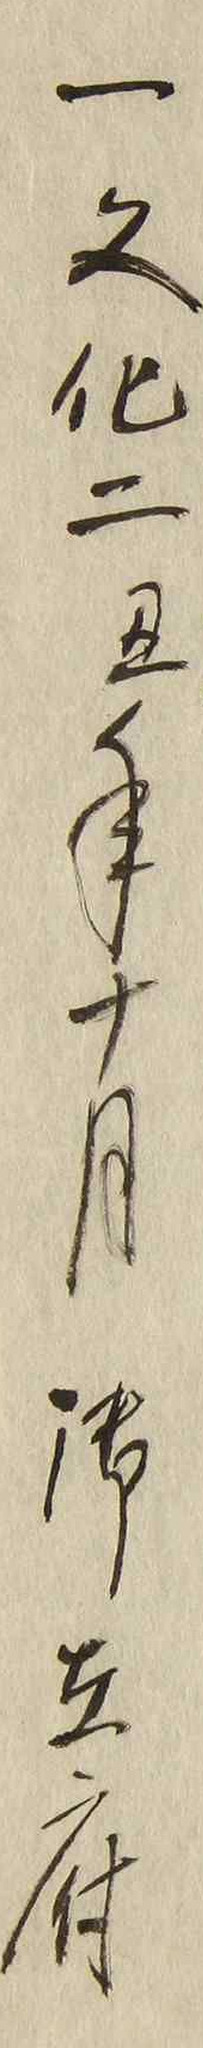一文化二丑年十月御在府

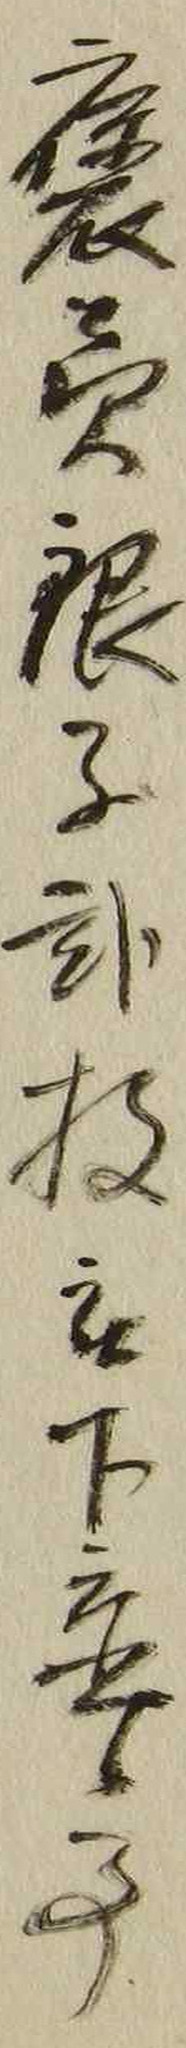褒美銀子弐枚被下置候事
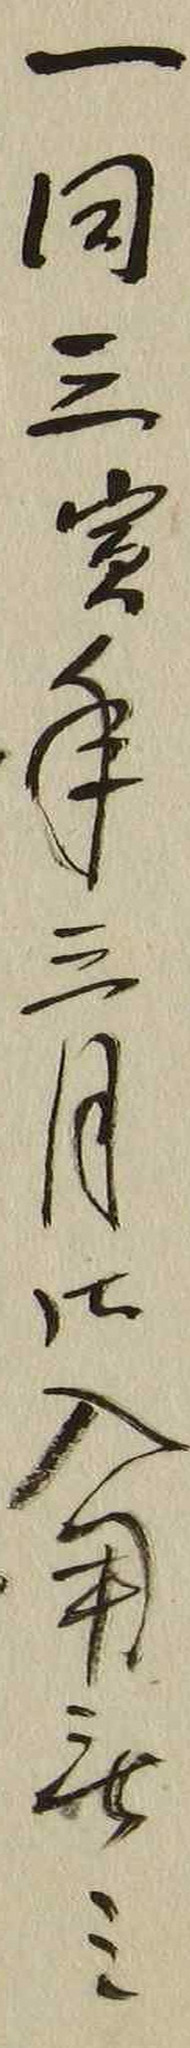一同三寅年三月御入用無之
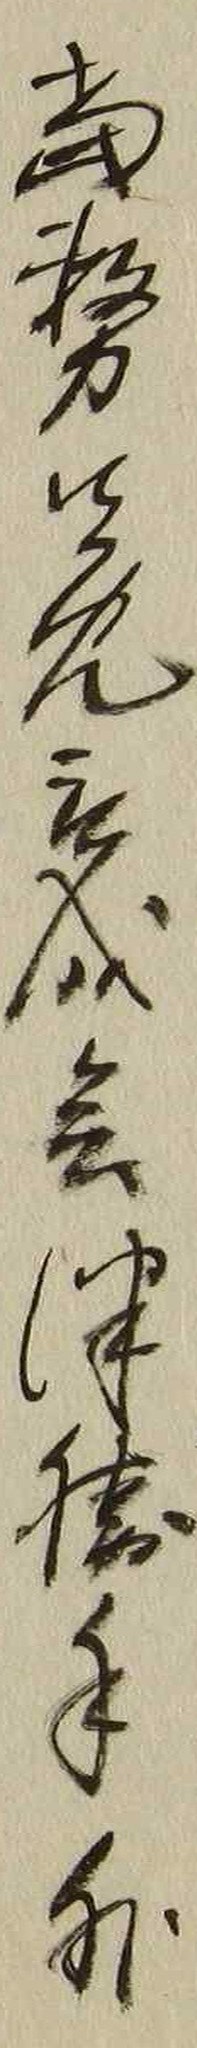当務御免被成会津勝手外
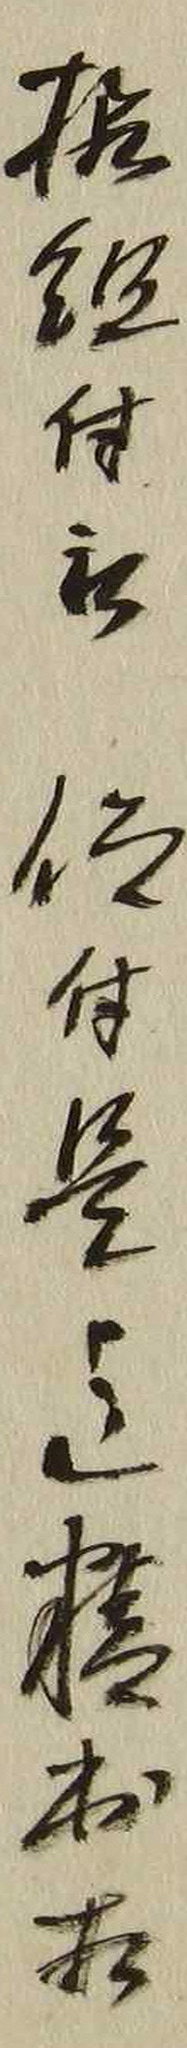様組付被仰付是迄精出相
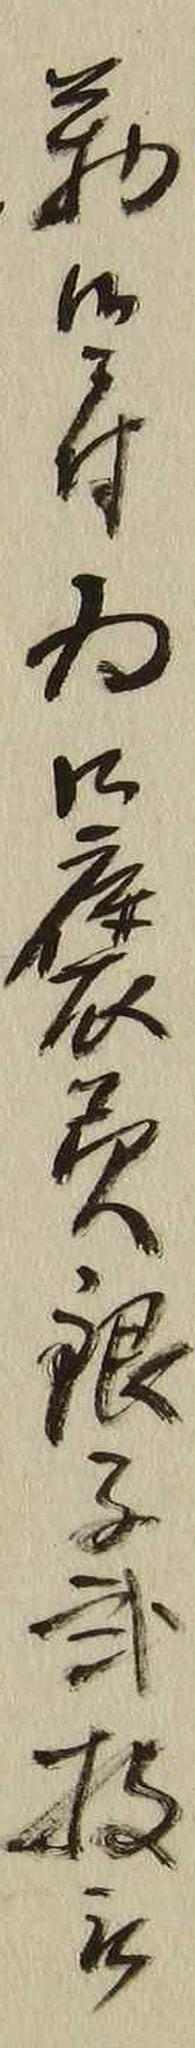勤候ニ付為御褒美銀子弐枚被
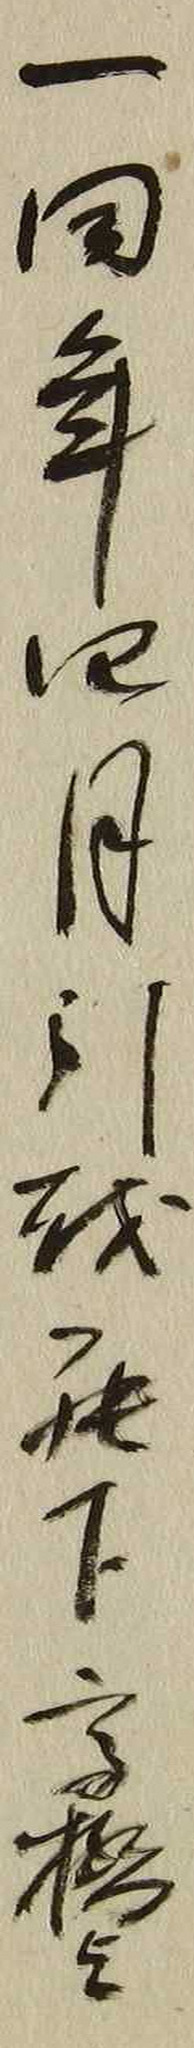一同年四月引越罷下高橋与
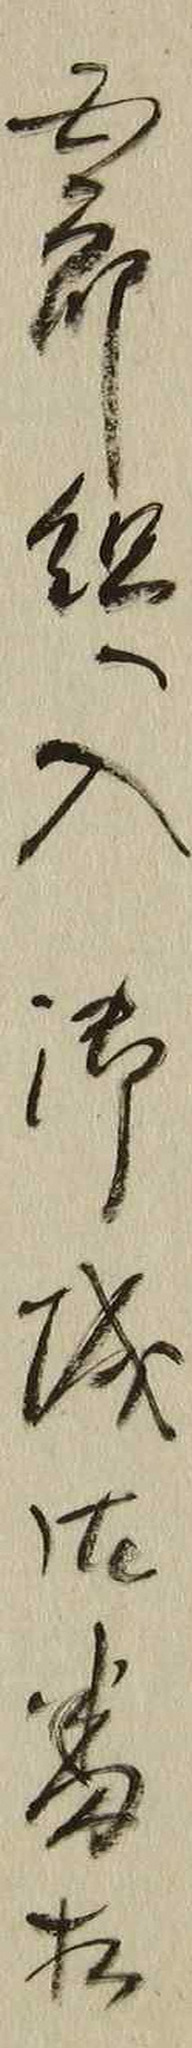五郎組へ入御城御番相
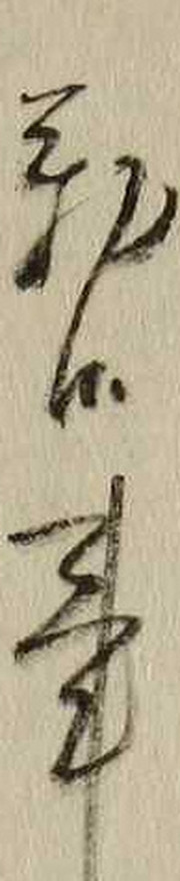勤候事
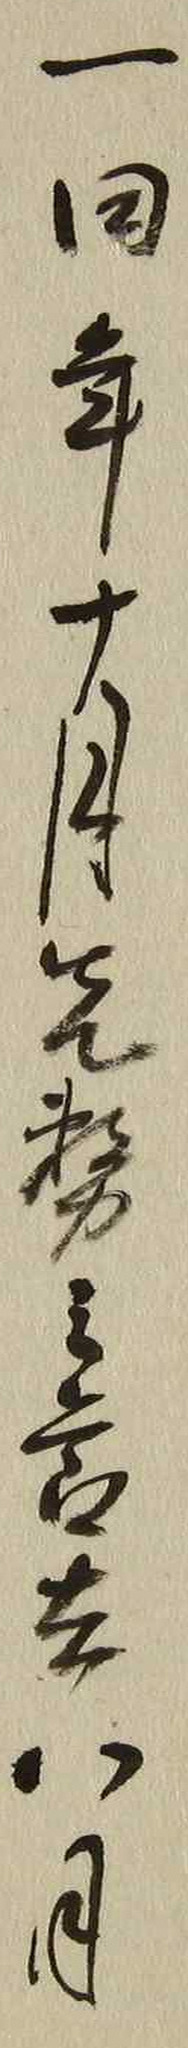一同年十月先務之節去八月
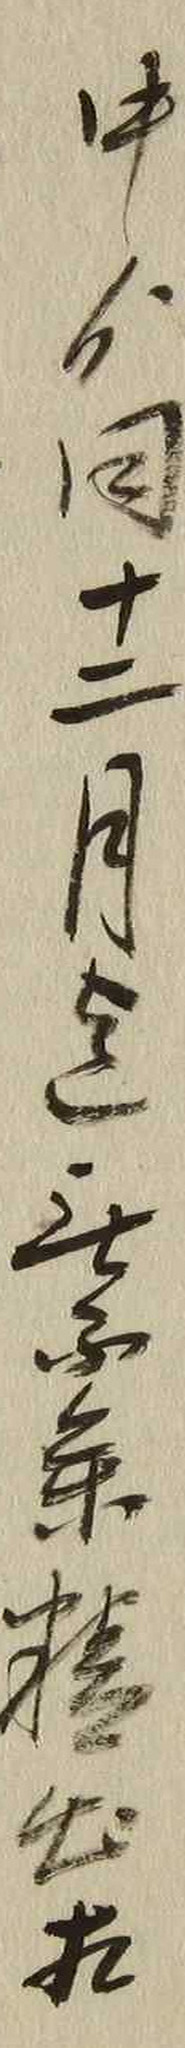中ゟ同十二月迄無不参精出相
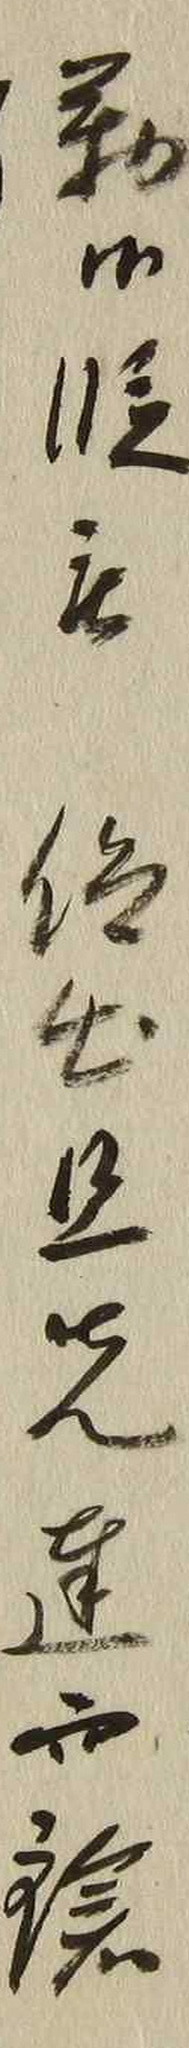勤候段被仰出且先達而鎗
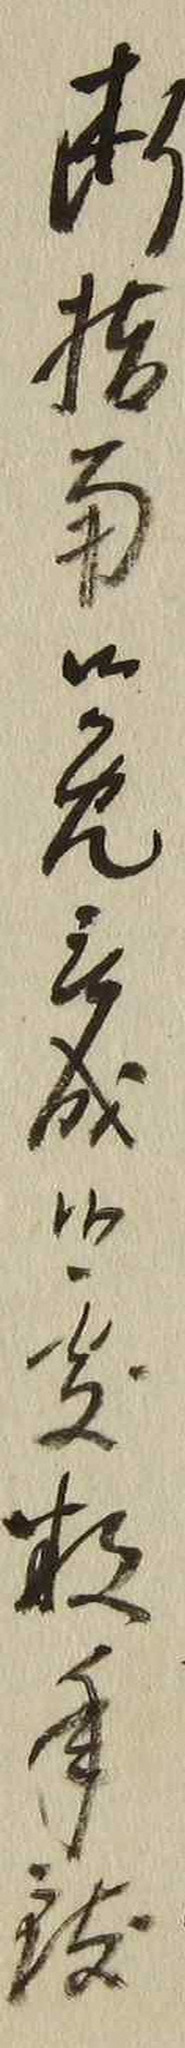術指南御免被成候処数年致
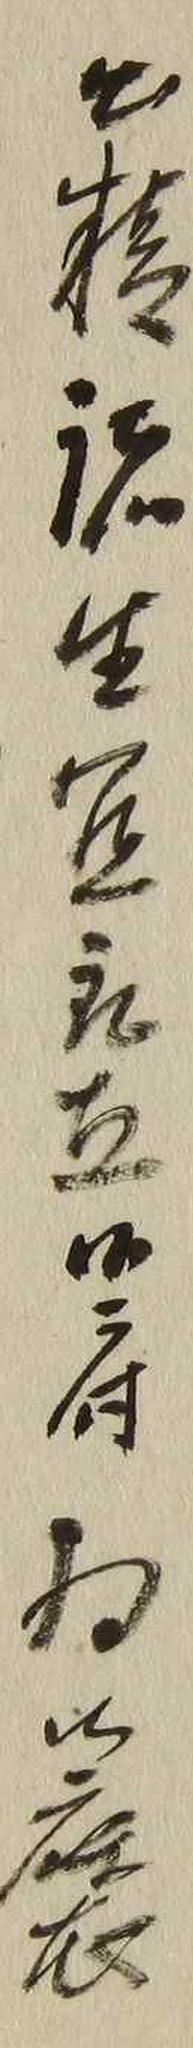出精諸生宜取立候ニ付為御褒
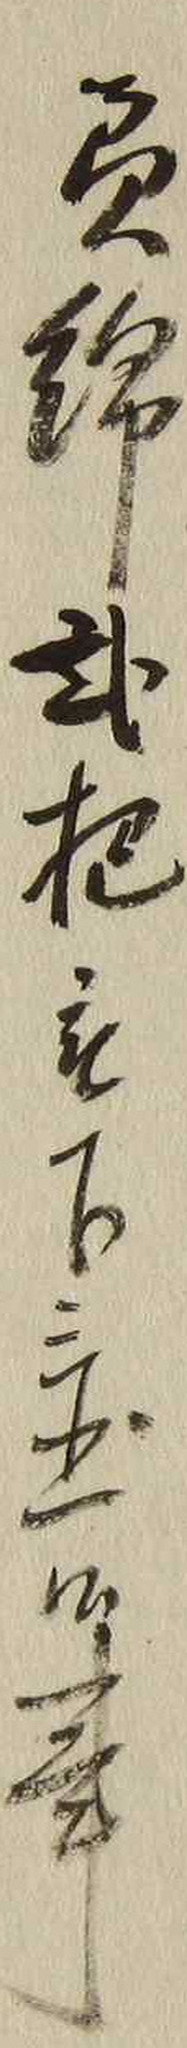美綿弐把被下置候事
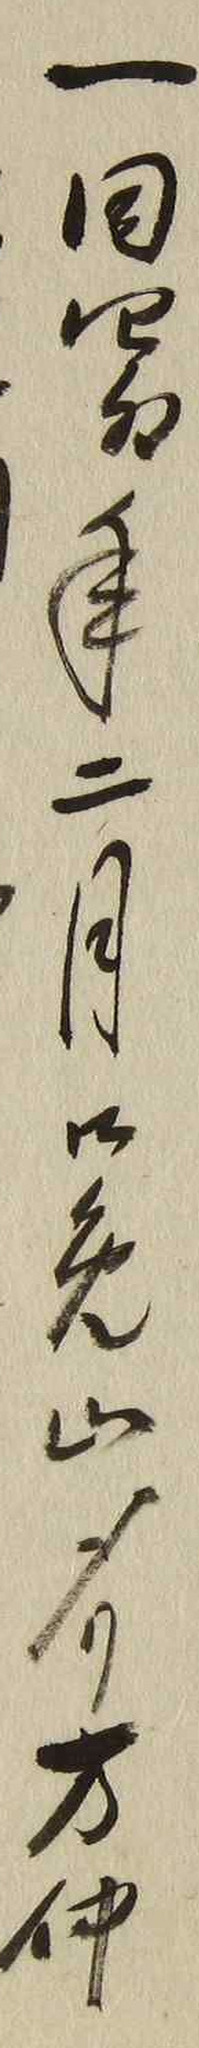一同四卯年二月御免山〆り方仲
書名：諸士系譜　巻之359　す之部9
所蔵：会津若松市立会津図書館
